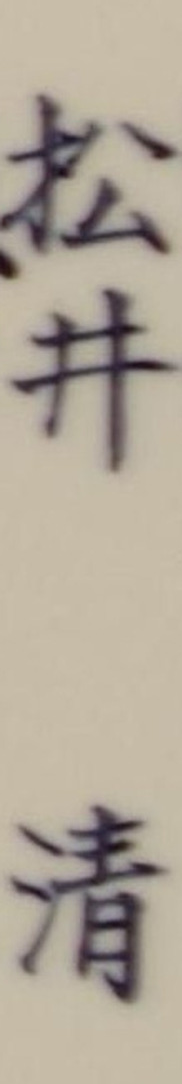松井清
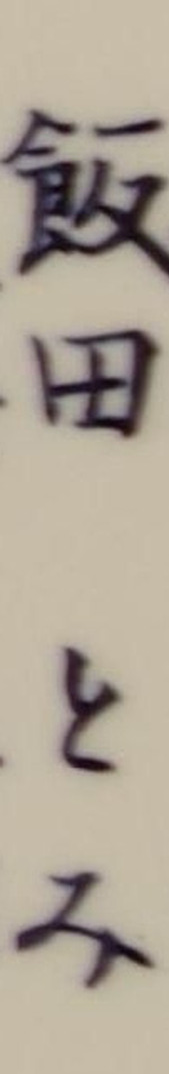飯田とみ
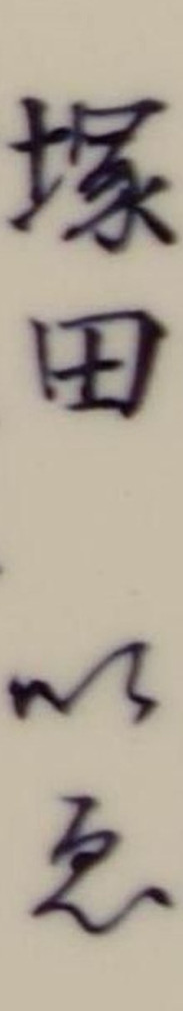塚田いゑ
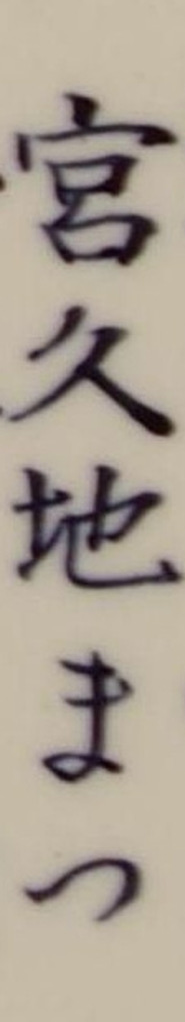宮久地まつ
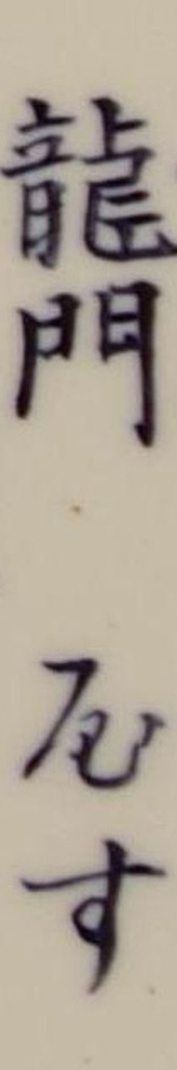龍門やす
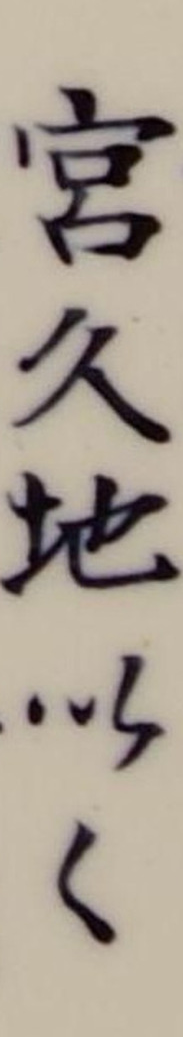宮久地いく
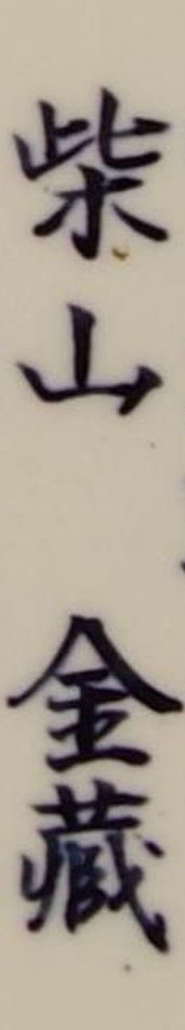柴山金蔵
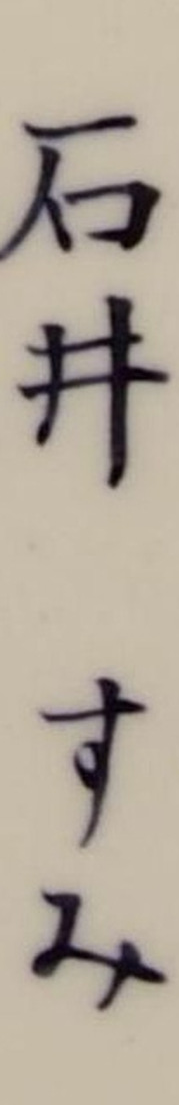石井すみ
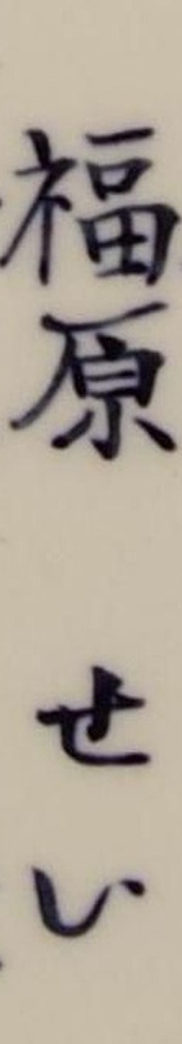福原せい
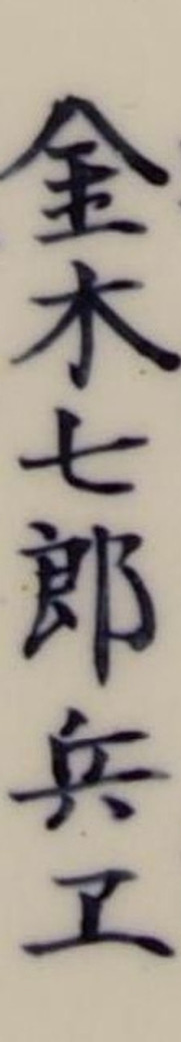金木七郎兵ヱ
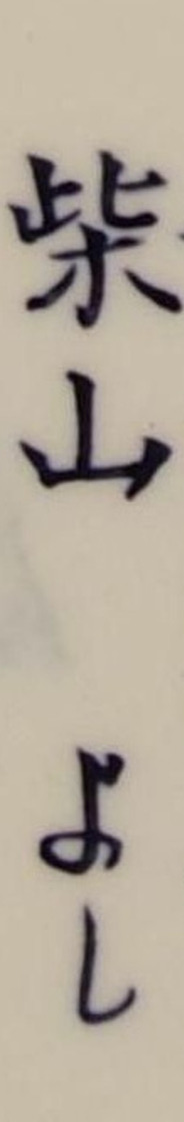柴山よし
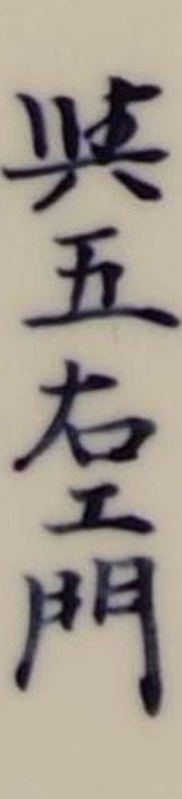与五右エ門
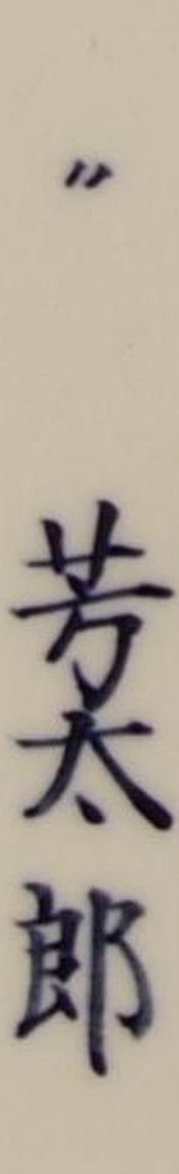芳太郎
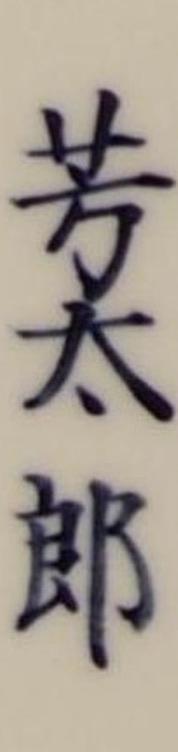芳太郎

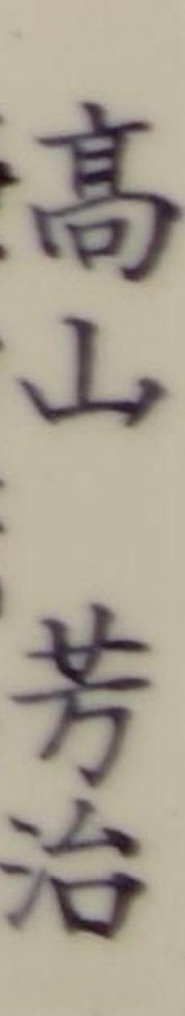高山芳治
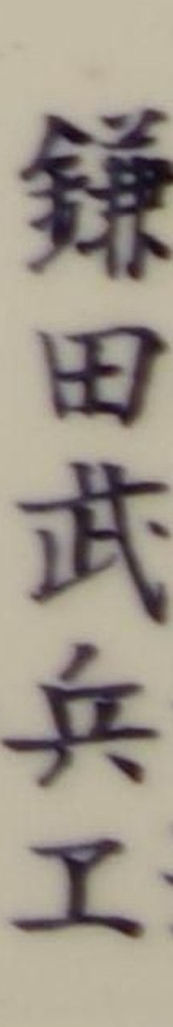鎌田武兵ヱ
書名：M~S
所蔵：高野山金剛峯寺
